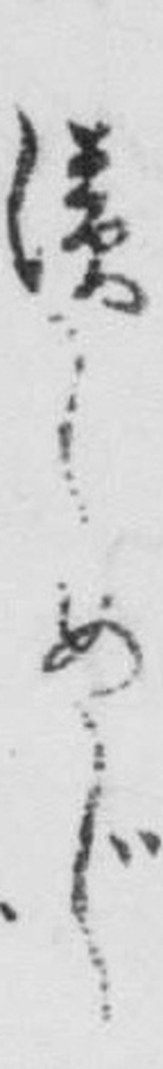漬しめじ
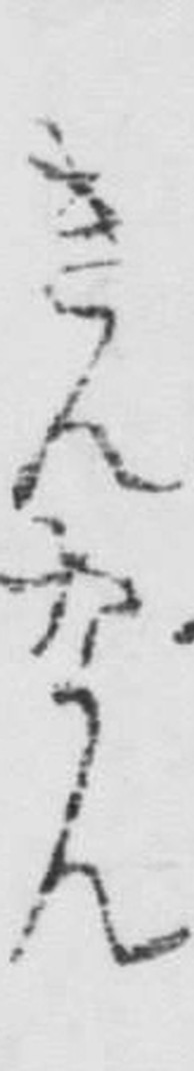きんなん
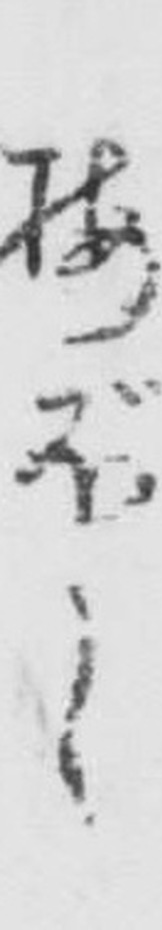梅ぼし
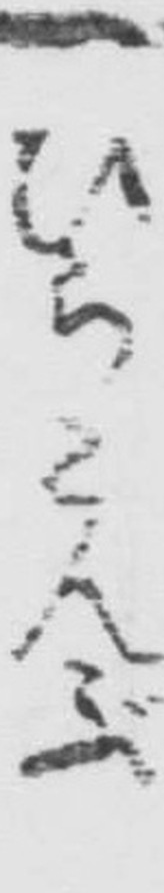ひらこんぶ
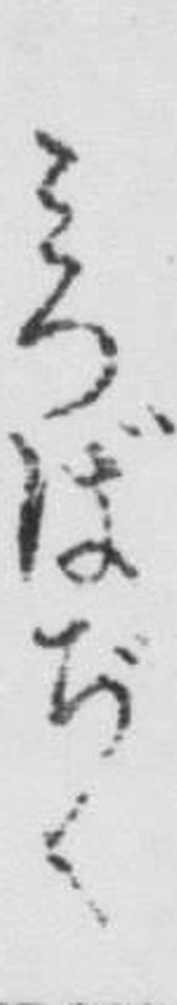みつばぢく
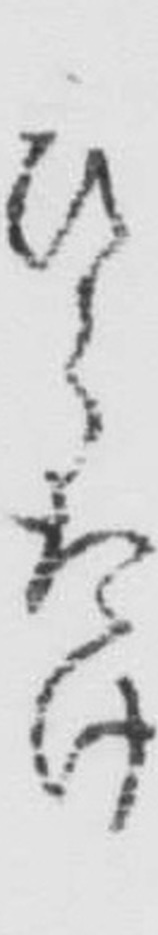ひらたけ
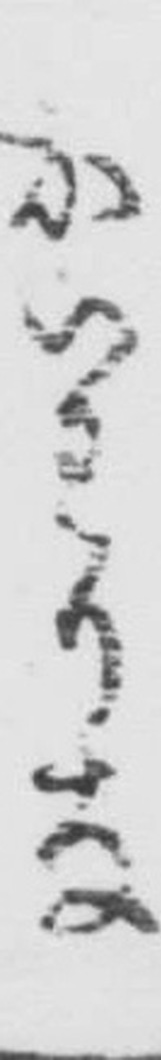かいわりな
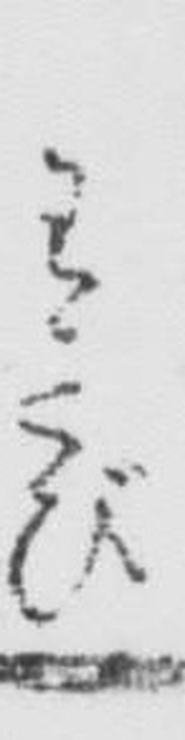わさび
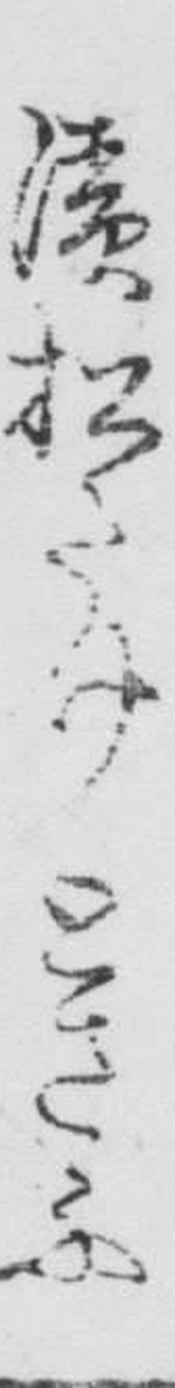漬松たけとさふ
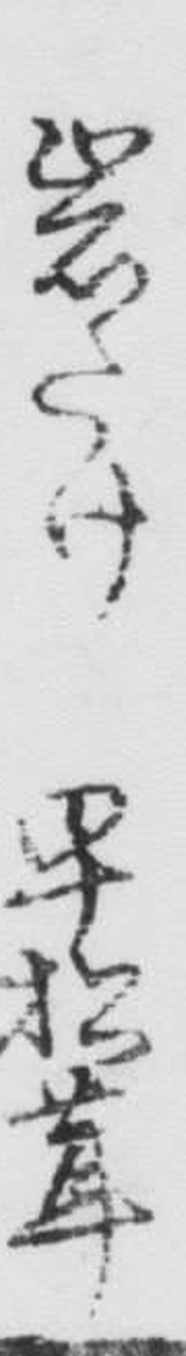岩たけ早松茸
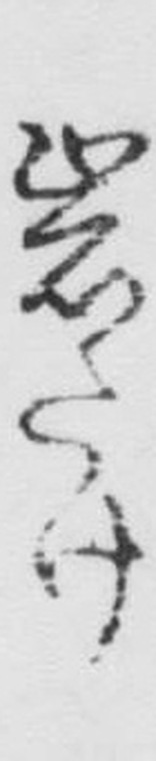岩たけ
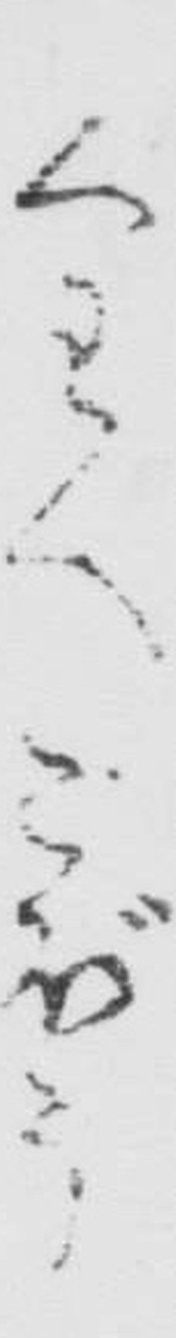くわへこぼう
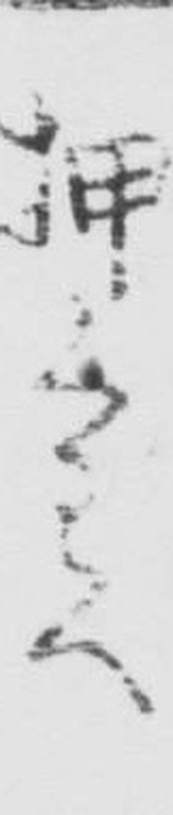押くわへ
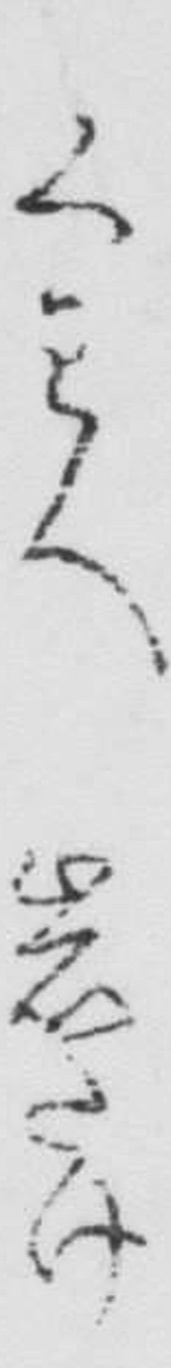くわへ岩たけ
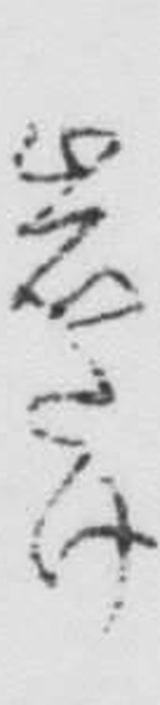岩たけ
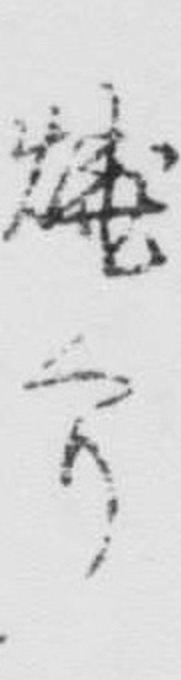焼くり
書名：諸家通用/即席料理
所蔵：大阪府立大学学術情報センター 国文学研究資料館
